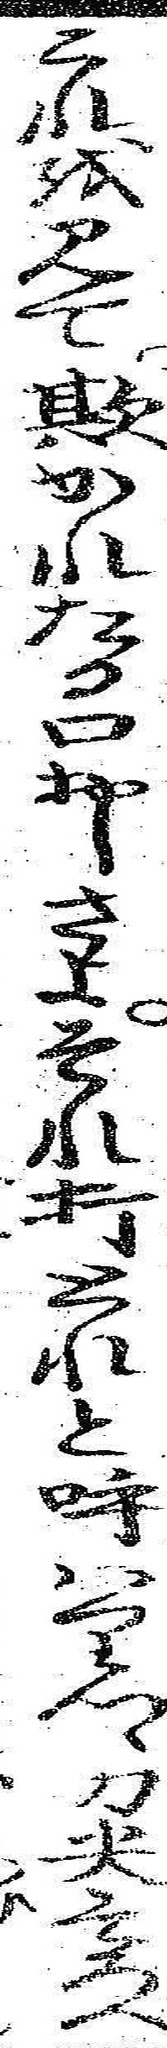これを見て。欺かれたる口おしさよ。それ打とれと呼はりつゝ。刀尖そろへ
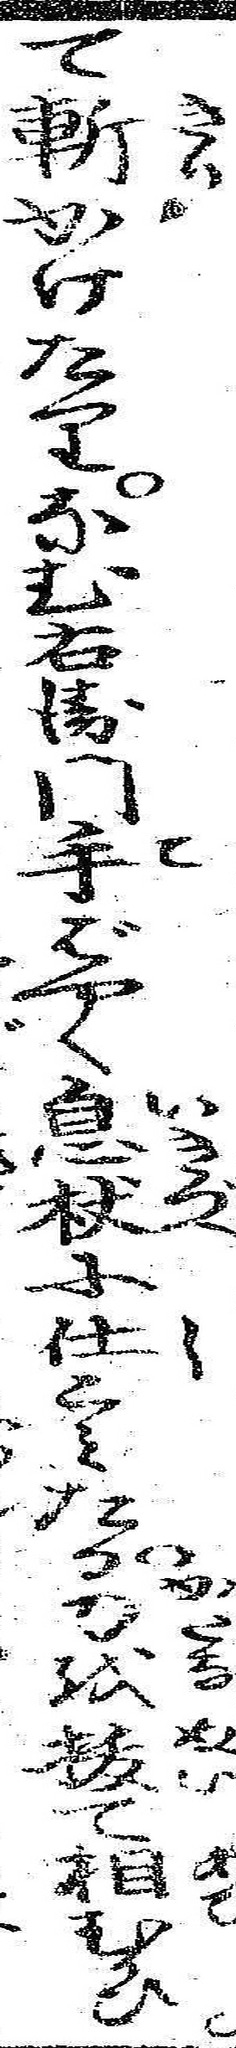て斬かけたり。なむ右衛門手ばやく息杖に仕こみたる。刀を抜て相むかひ。
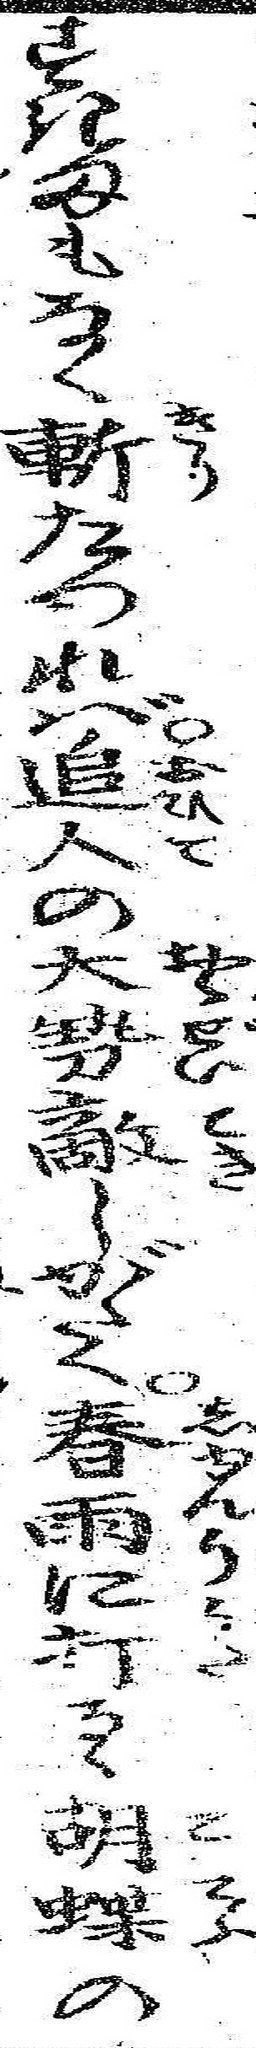すきまもなく斬たつれば。追人の大勢敵しがたく。春雨に打るゝ胡蝶の
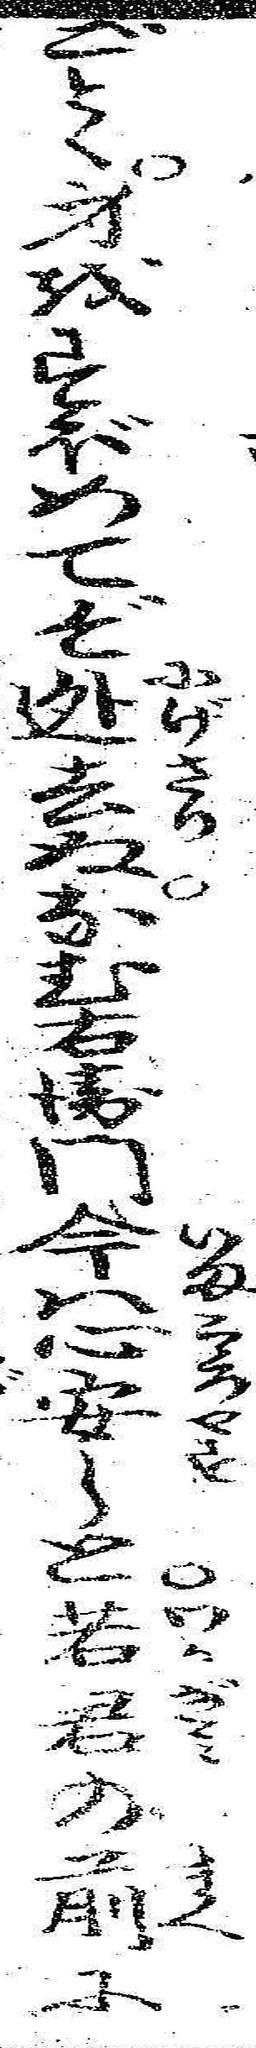ごとく。身をすぼめてぞ逃去ぬ。なむ右衛門今は心安しと。若君の前に
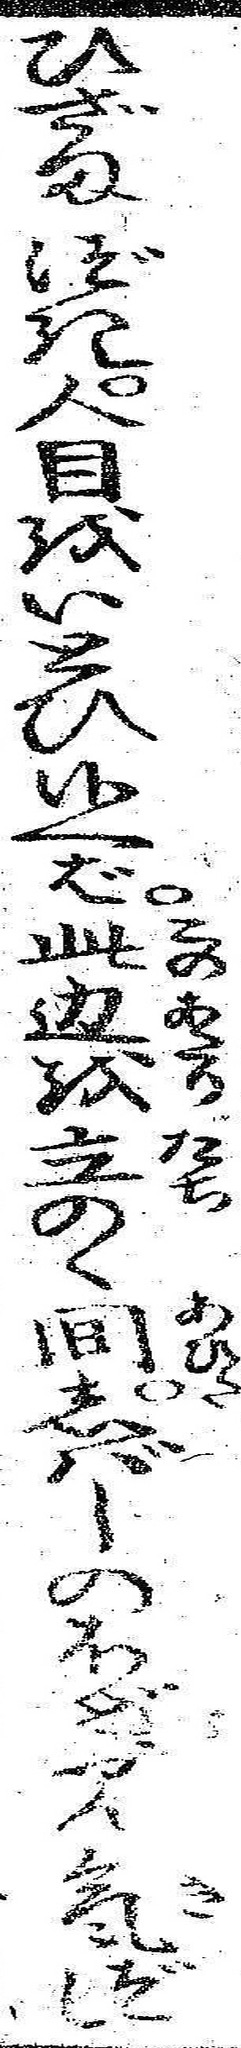ひざまづき。人目をいとひ候へば。此辺を立のく間。しばしのほどおん気づ
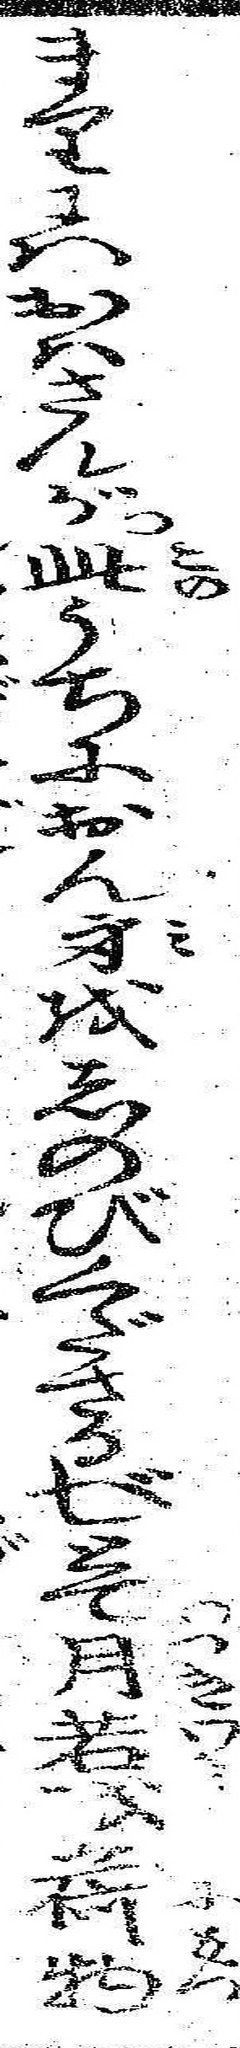まりにはおはさんが。此うちにおん身をしのびくださるべしとて。月若を荷物
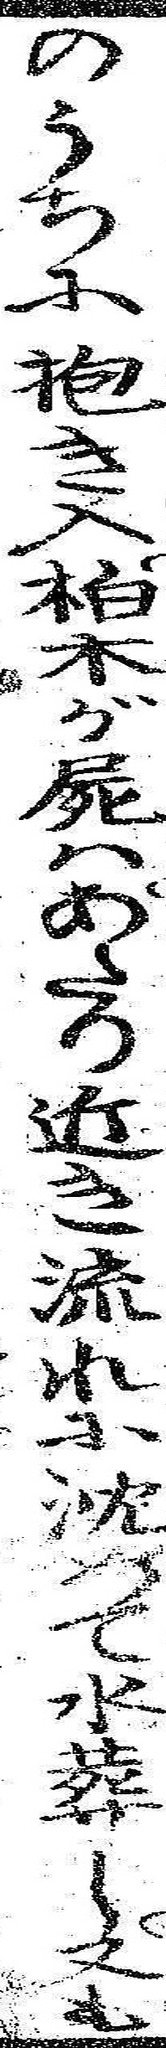のうちに抱き入。柏木が屍は。あたり近き流れに沈めて水葬し。又も
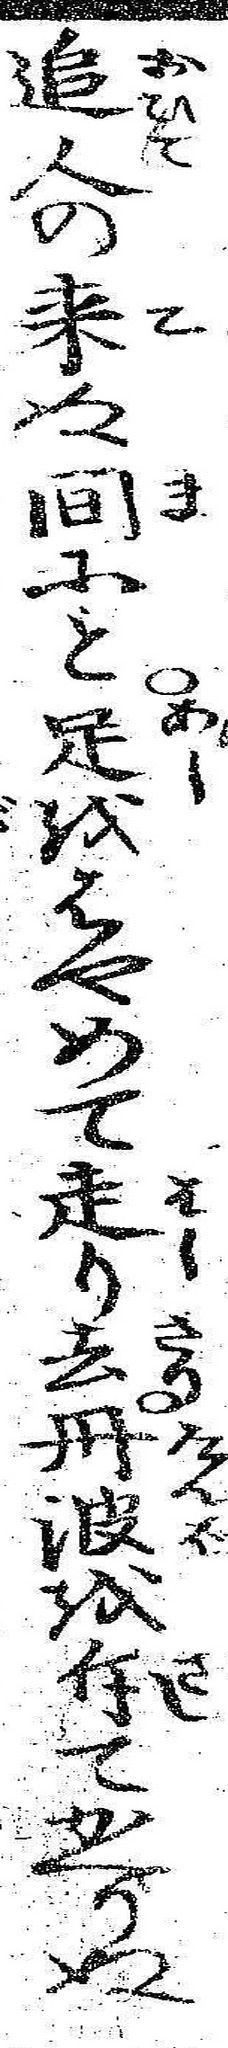追人の来ぬ間にと。足をはやめて走り去。丹波を斥てかへりぬ
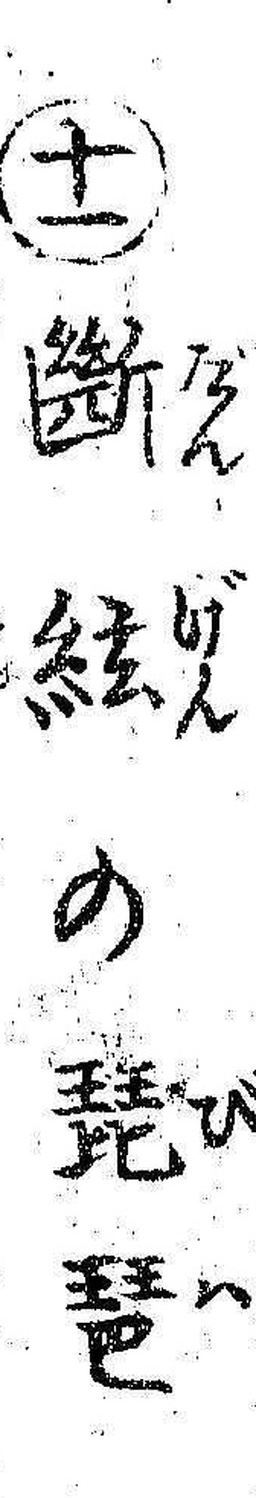十一断絃の琵琶
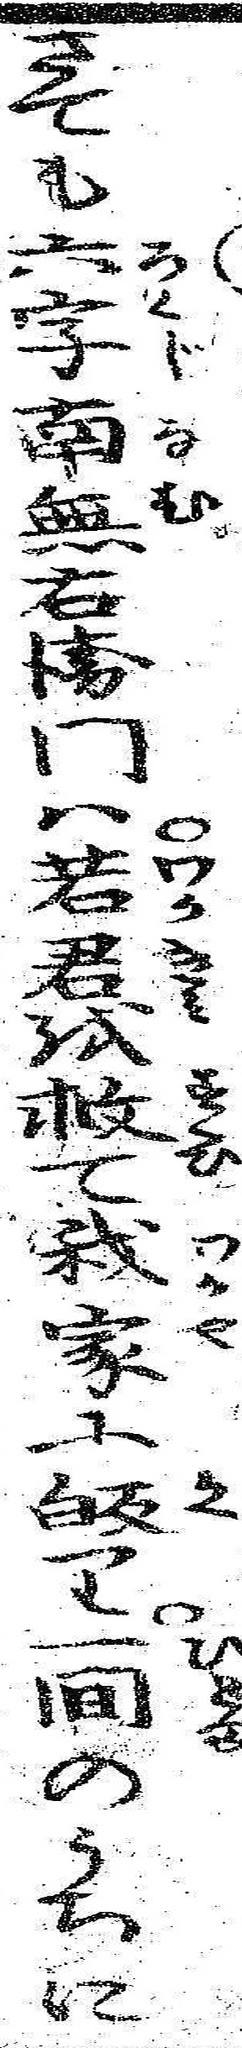さても六字南無右衛門は。若君を救て我家に帰り。一間のうちに

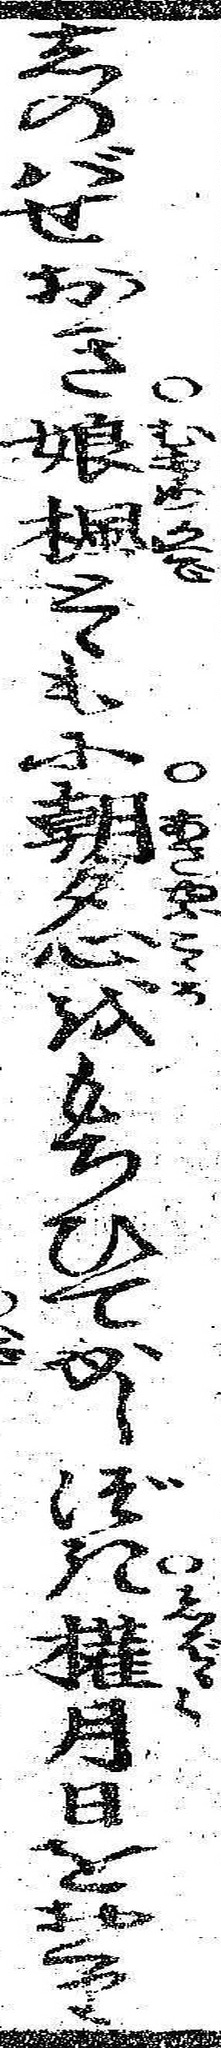しのばせおき。娘楓とゝもに。朝夕心をもちひてかしづき。権月日をおくり
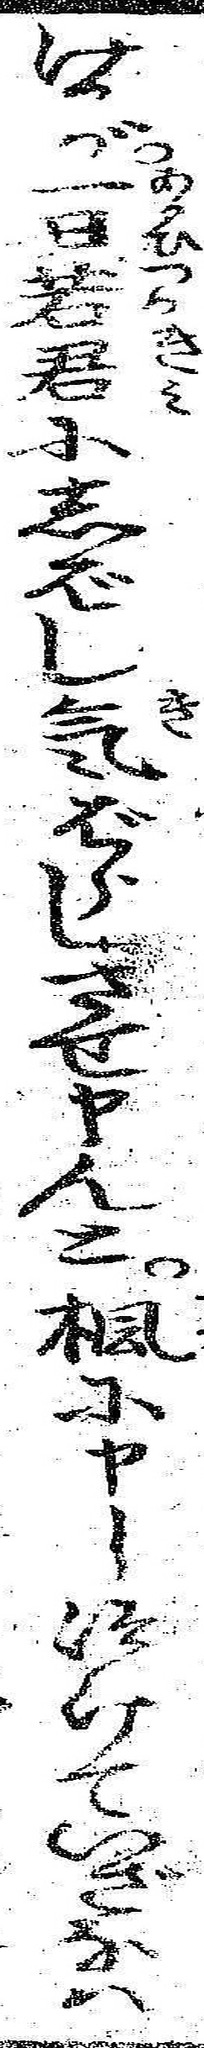けるが。一日若君にしばし気ばらしさせ申んと。楓に申しつけていざなは
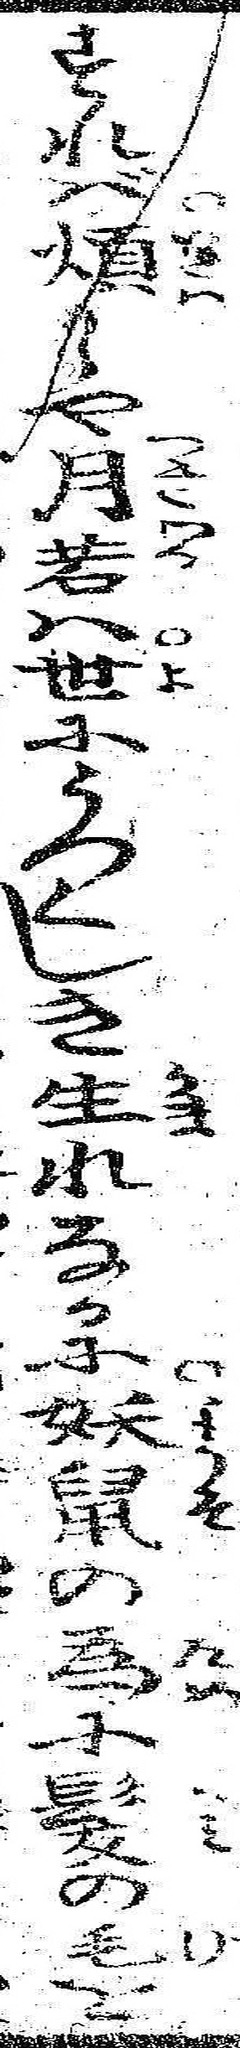すれば。煩しや月若は。世にうつくしき生れなるに。妖鼠の為に髪の毛を
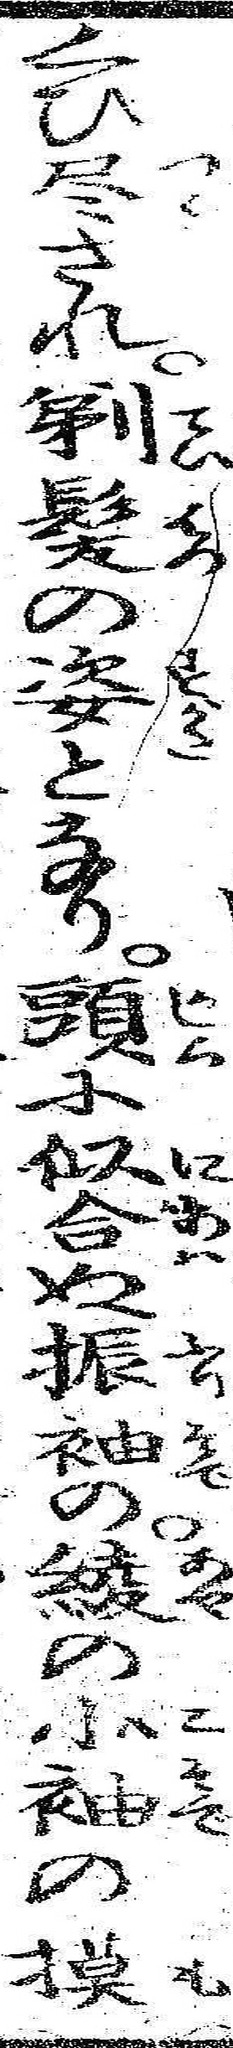くひ尽され。剃髪の姿となり。頭に似合ぬ振袖の。綾の小袖の模
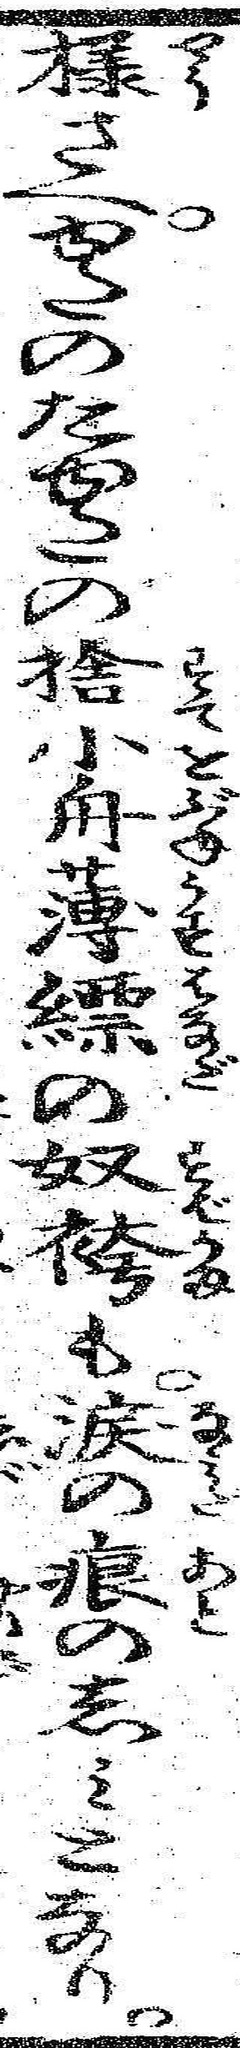様さへ。ゆたのたゆたの捨小舟薄縹の奴袴も。涙の痕のしみとなり。
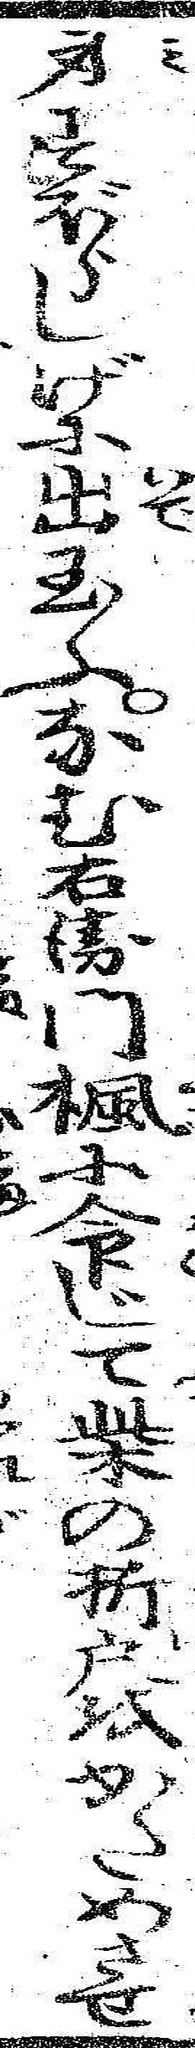身すぼらしげに出玉ふ。なむ右衛門楓に命じて。柴の折戸をかためさせ。
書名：昔話稲妻表紙
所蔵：国文学研究資料館
